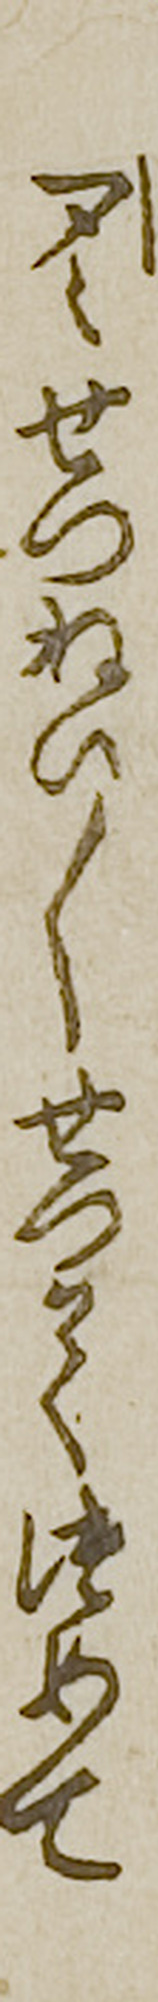持丸「あゝせつねい〳〵せつかくつめて
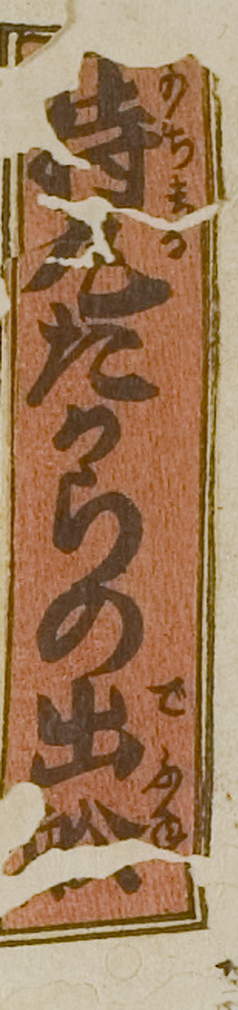持丸たからの出船
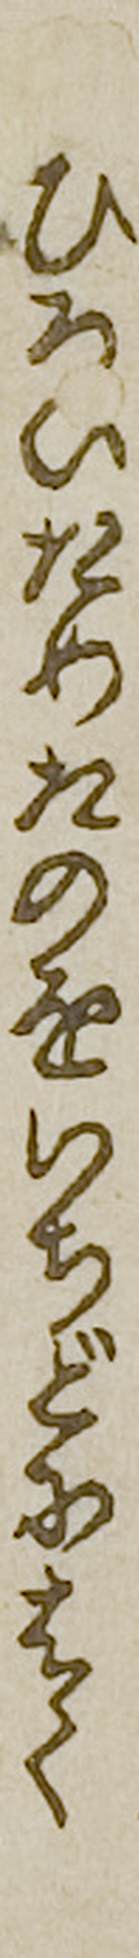ひろいためたのをいちどにはく
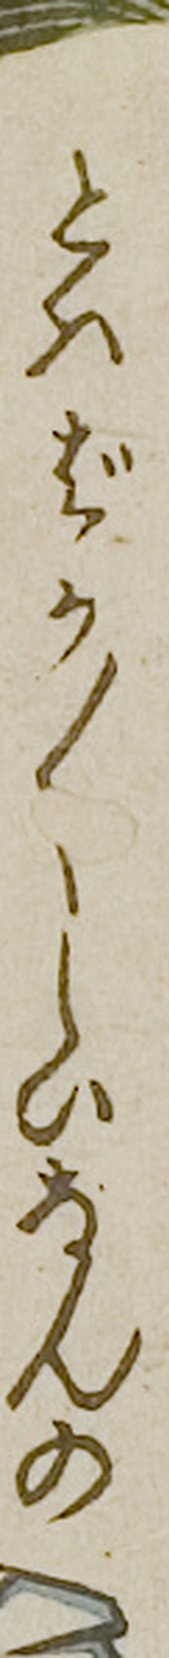とはばか〳〵しいなんの
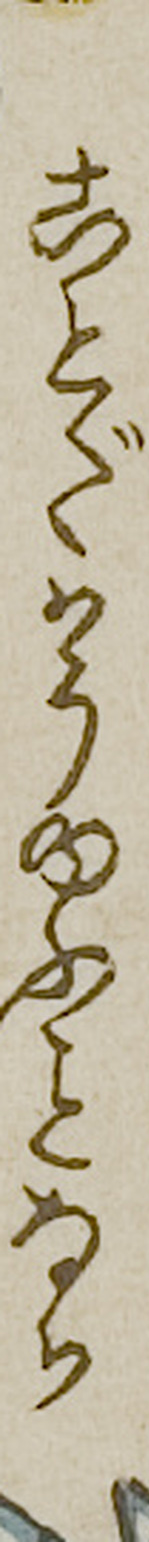ことだかうゆふことなら
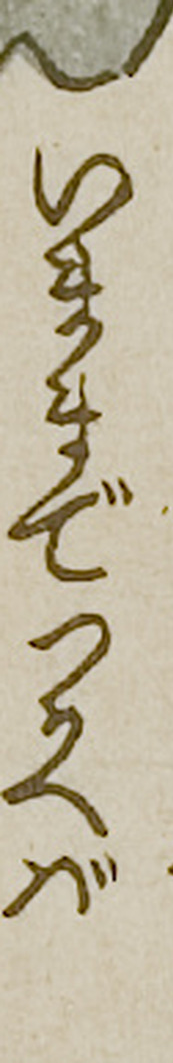いままでつかへば
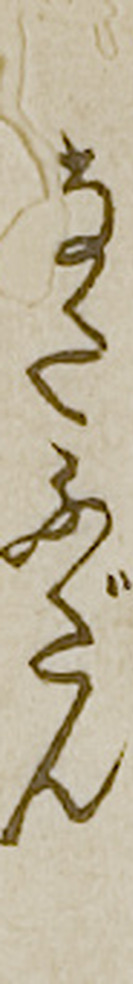なたふだん
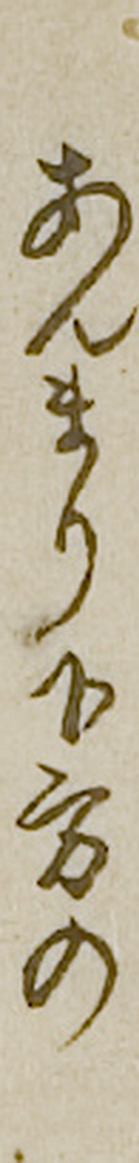あんまり下法の
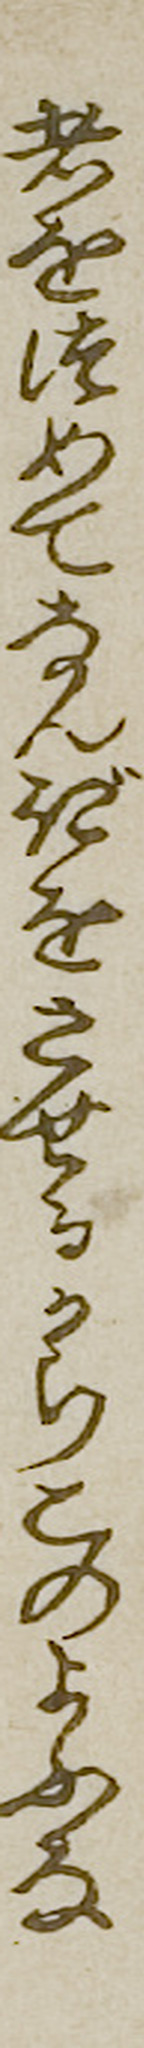者をつめてなんぎをさせるからこのよふな
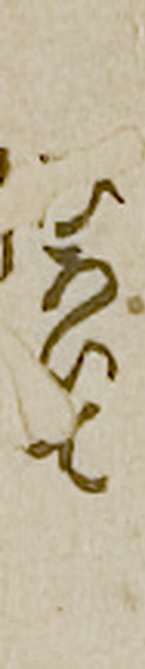ひろいて
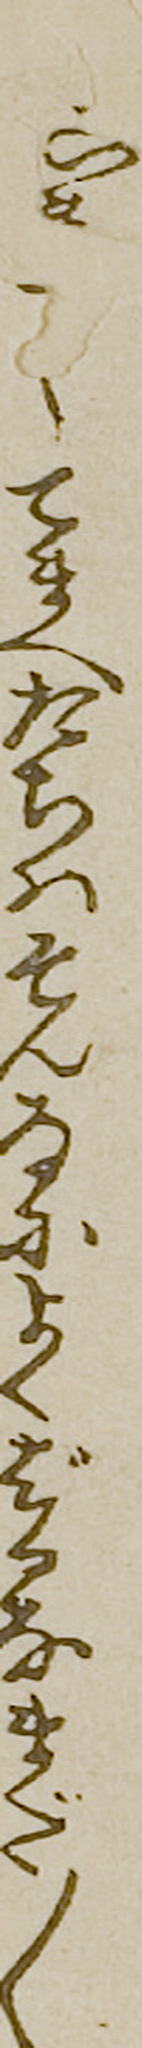「これ〳〵てまへたちはそんなによくばるなまだ〳〵
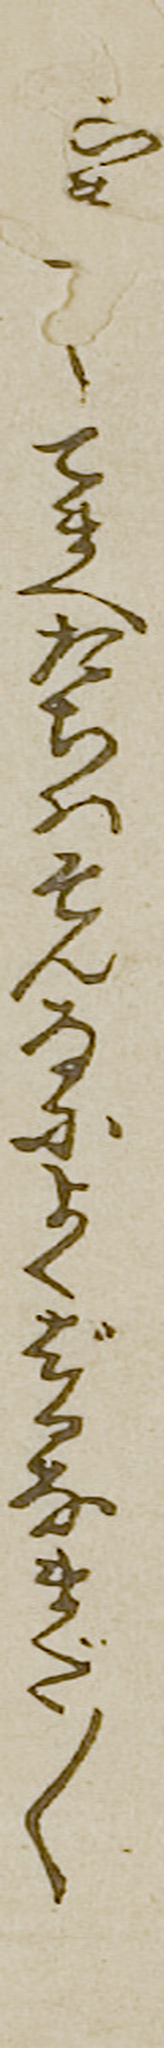「これ〳〵てまへたちはそんなによくばるなまだ〳〵
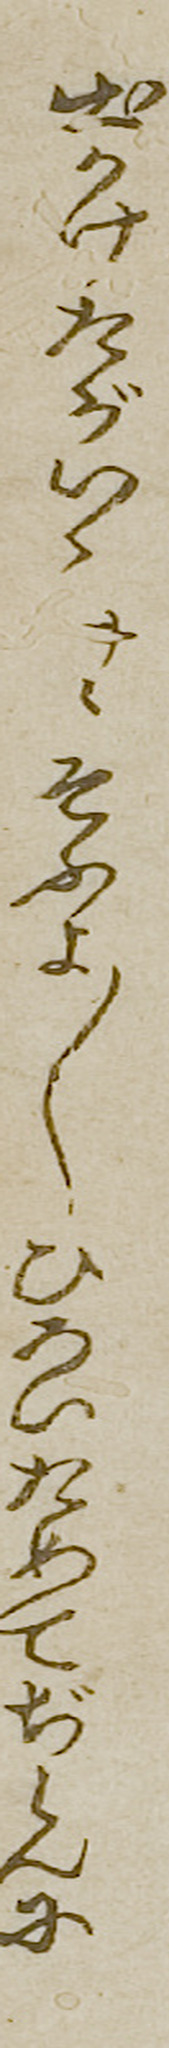出かけたがいゝをゝそふよ〳〵ひろいためてぢしんに
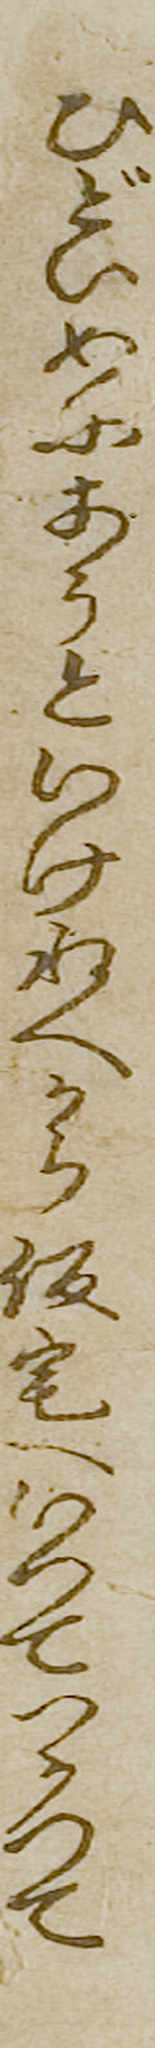ひどいめにあうといけねへから仮宅へいつてつかつて
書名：持丸たからの出船
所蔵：東京大学総合図書館 General Library in the University of Tokyo, JAPAN
